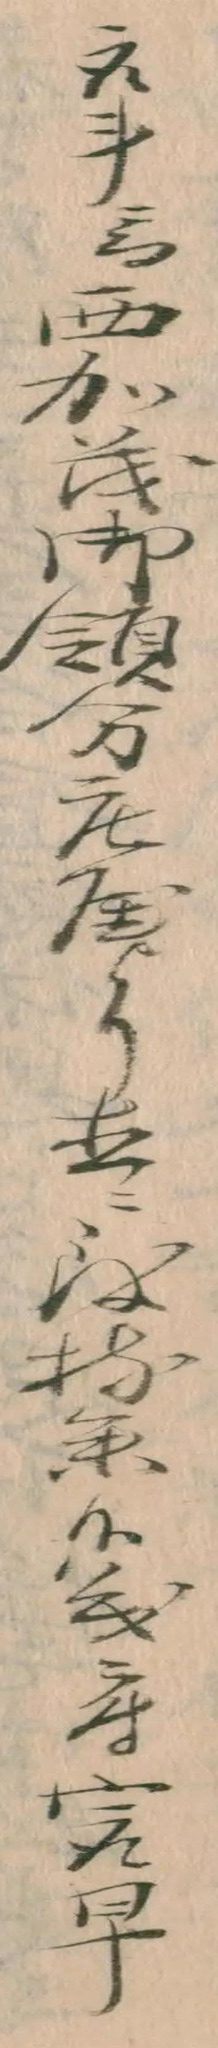取斗ニ而西加茂御領分庄屋より直ニ致持参候義ニ付最早
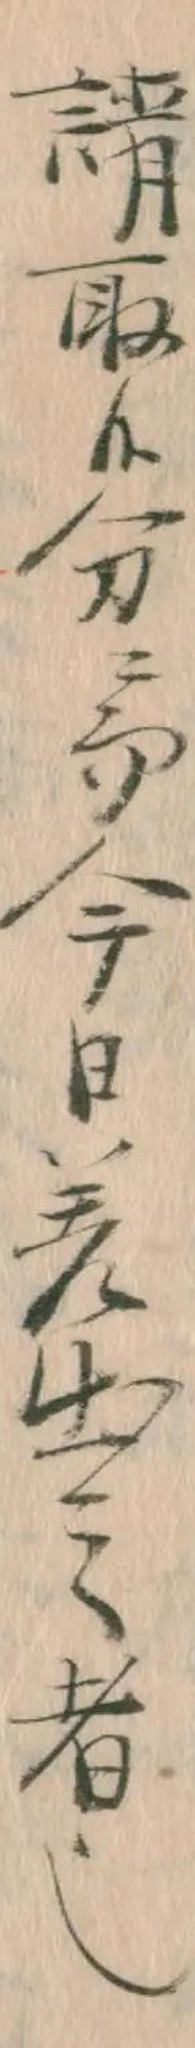請取候分ニ而今日差出之者也
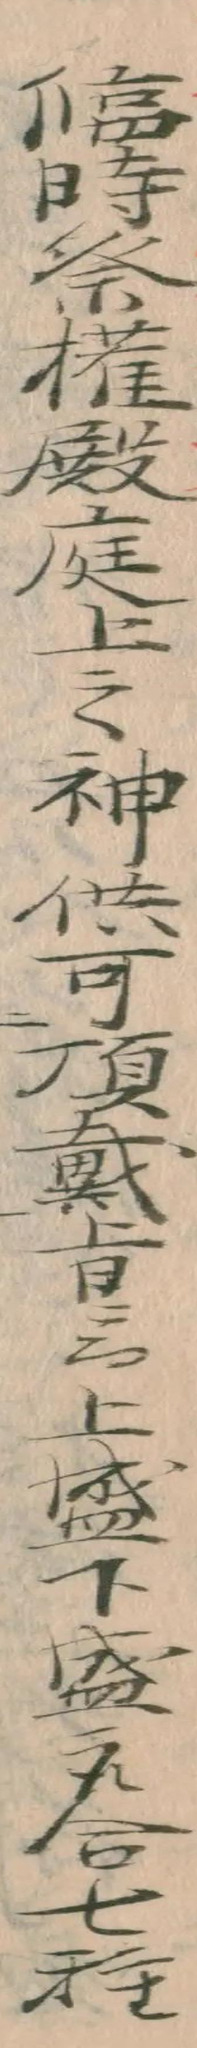一臨時祭権殿庭上之神供可頂戴旨ニ而上盛下盛取合七種
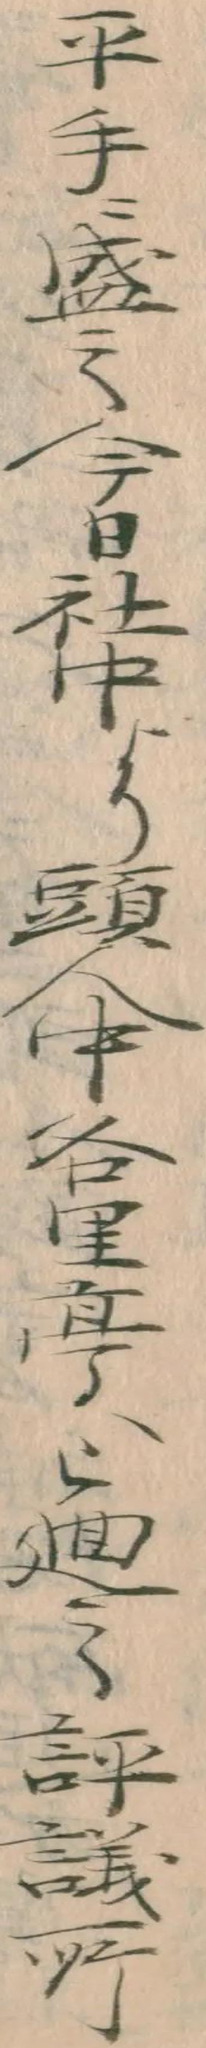平手ニ盛之今日社中より頭人中各里亭へ被廻之評議所
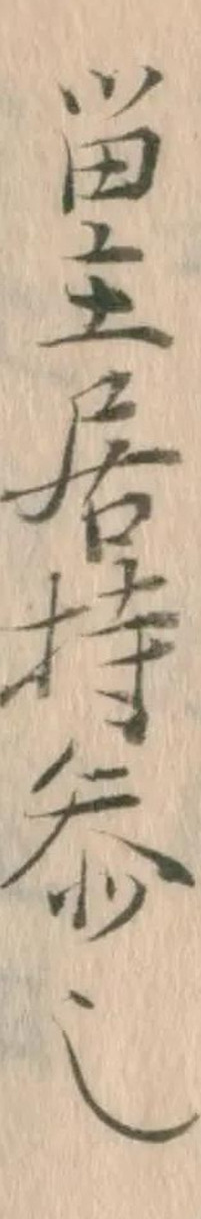留主居持参也
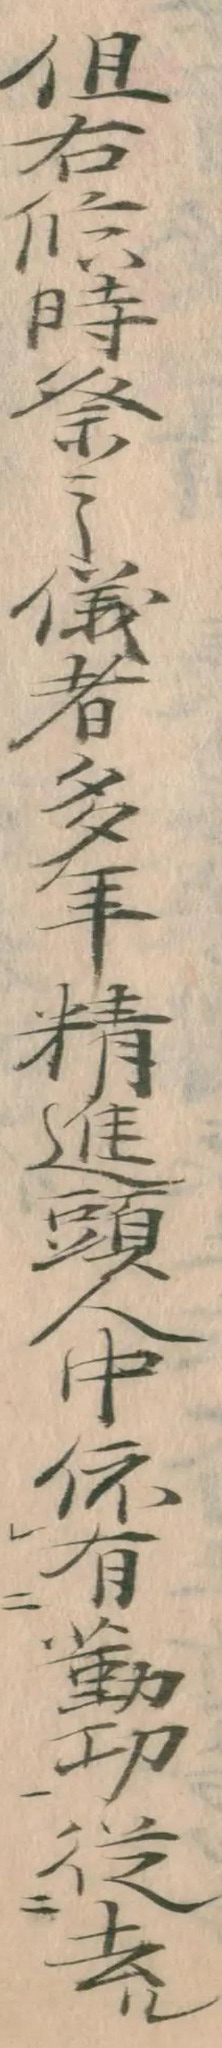但右臨時祭之儀者多年精進頭人中依有勤功従去ル
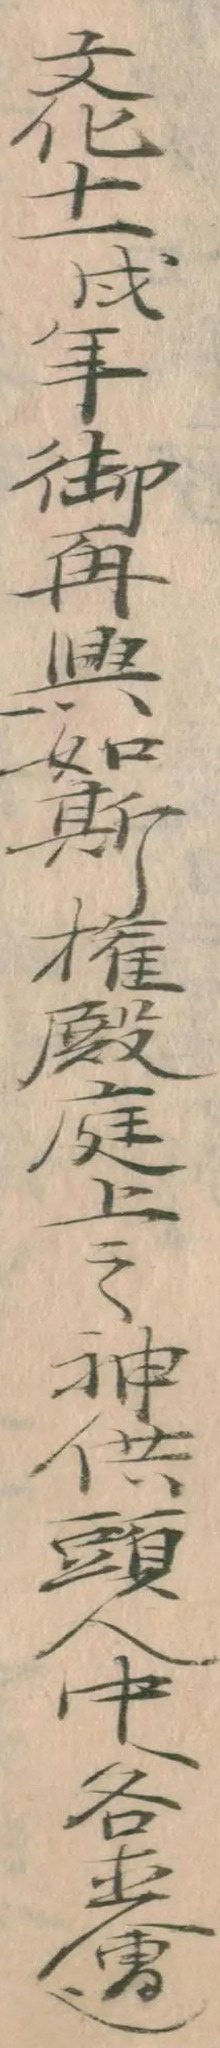文化十一戌年御再興如斯権殿庭上之神供頭人中へ各直會也
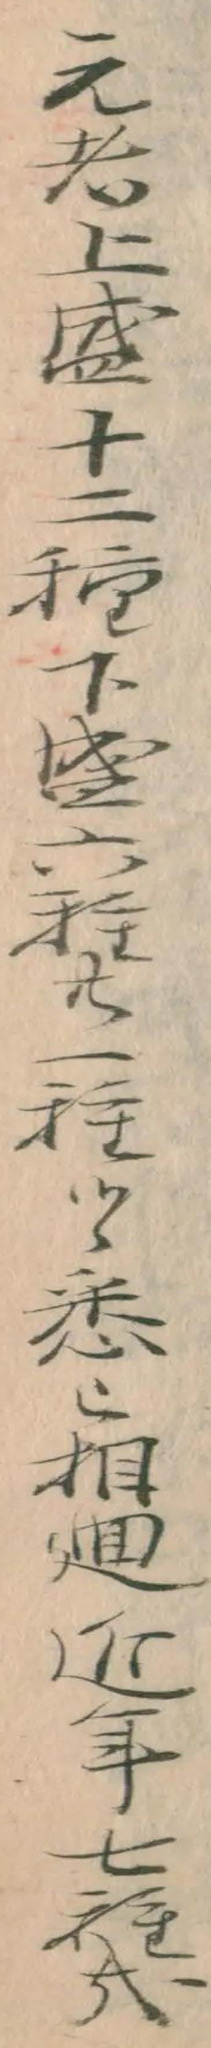元者上盛十二種下盛六種共一種ツヽ悉被相廻近年七種共

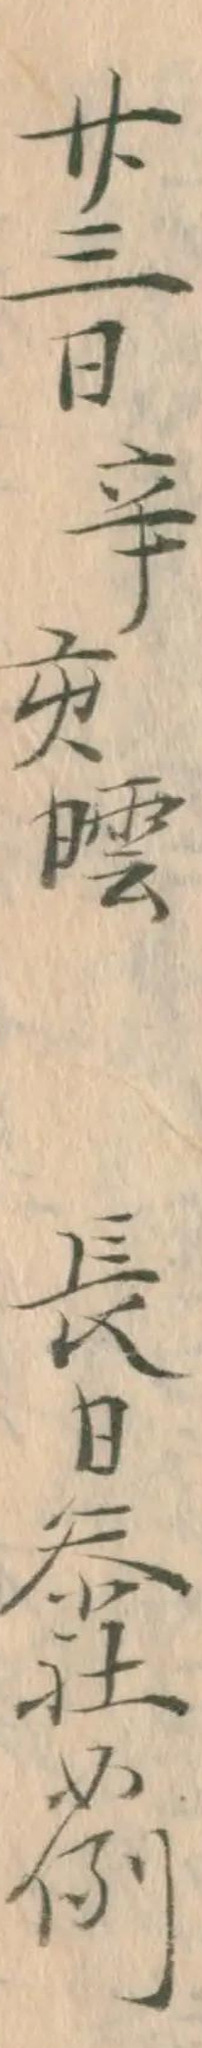廿三日辛亥曇長日参社如例
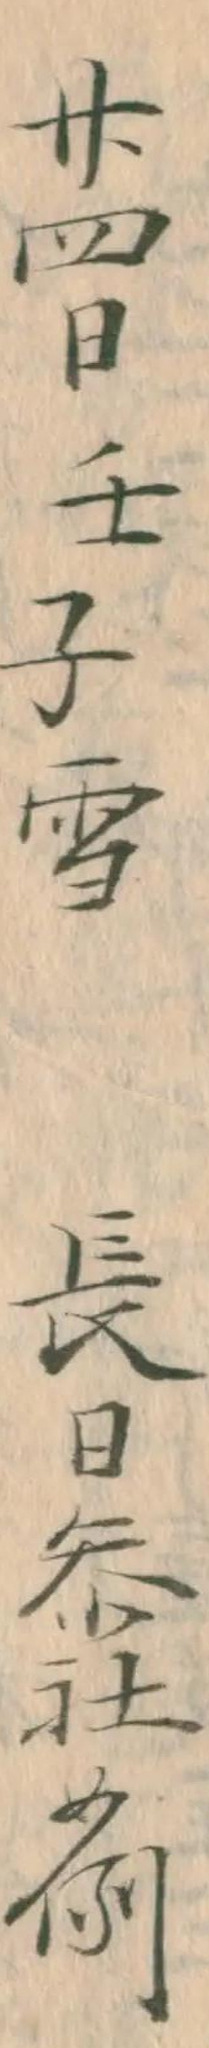廿四日壬子雪長日参社如例
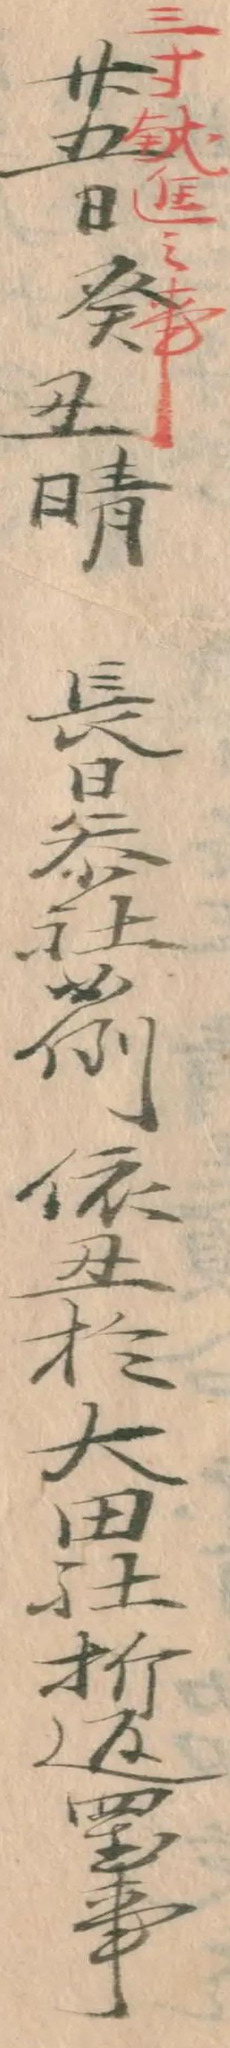廿五日癸丑晴長日参社如例依丑於大田社折返置事
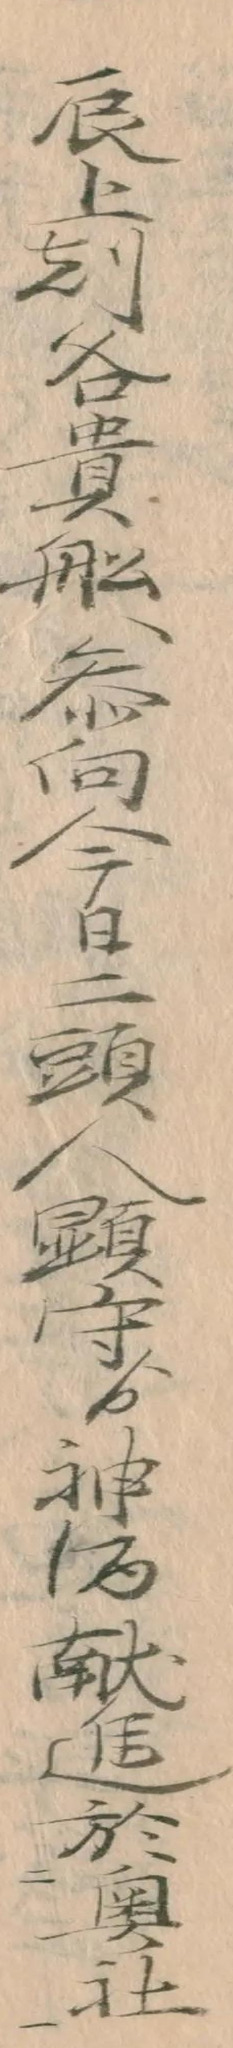一辰上刻各貴舩へ参向今日二頭人顕守ゟ神酒献進於奥社
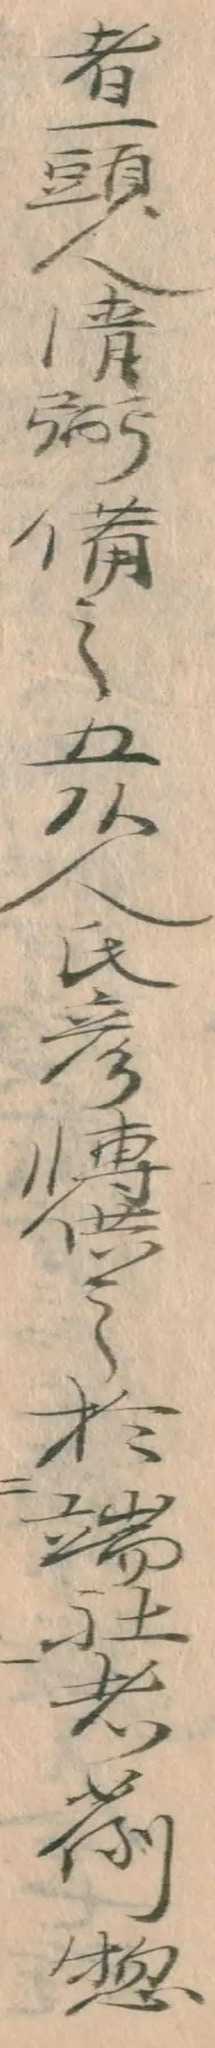者一頭人清弼備之五頭人民彦轉供也於端社者如例惣
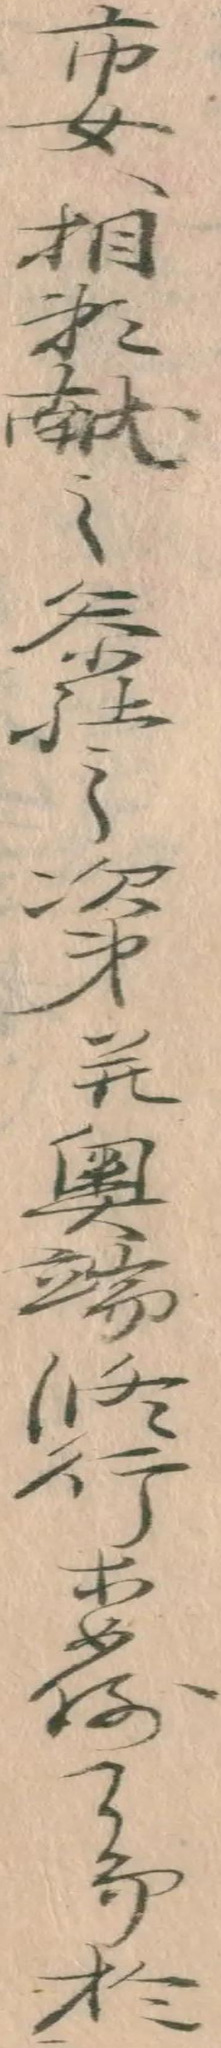市女へ相頼献之参社之次第并奥端修行等如何了而於
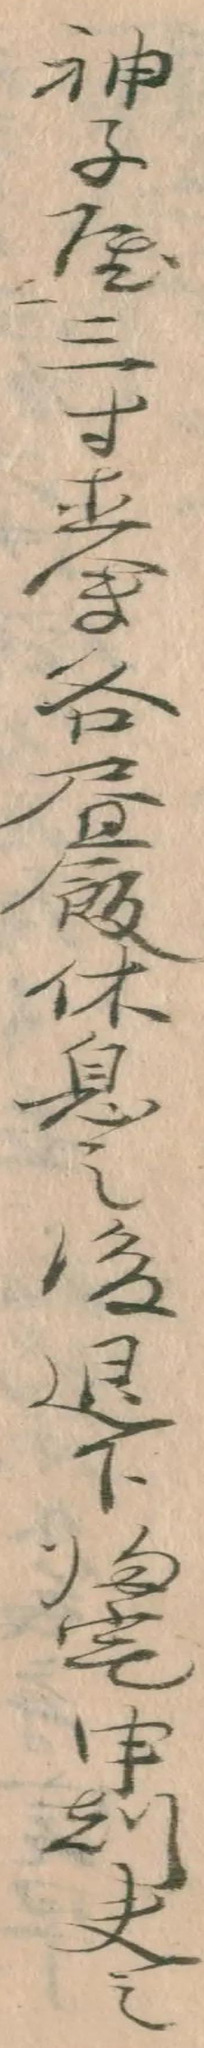神子屋三寸直會各昼飯休息之後退下帰宅申刻夫々
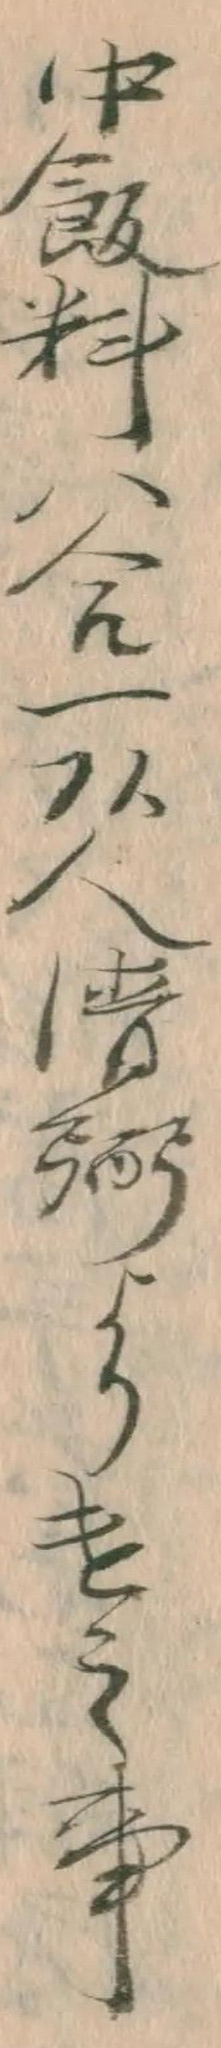中飯料八合一頭人清弼より遣之事
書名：賀茂社記録. 第74冊
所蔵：国立国会図書館 National Diet Library, JAPAN
